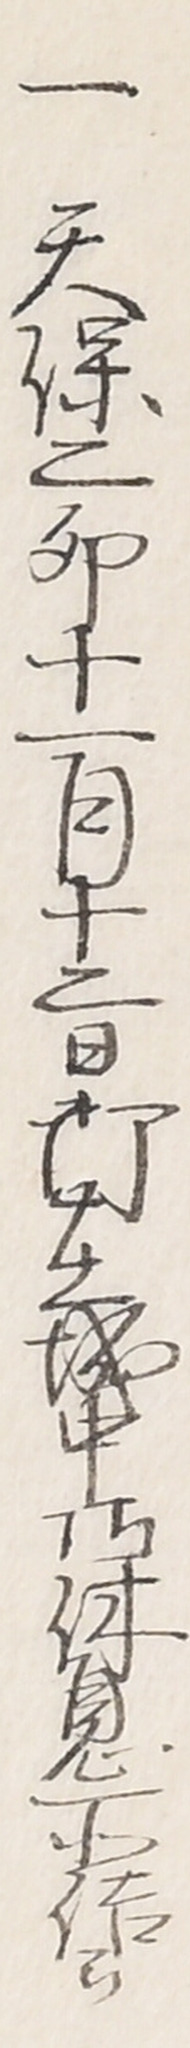一天保二卯十一月十二日御在城中御休息所詰被
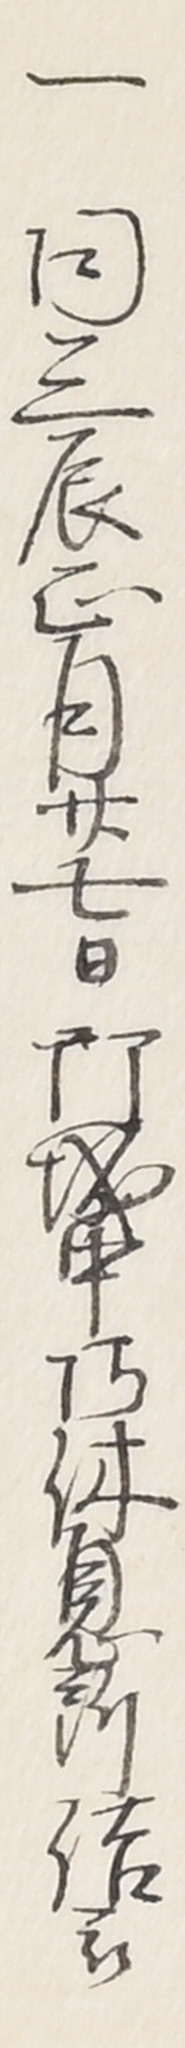一同三辰正月廿七日御在城中休息所詰被
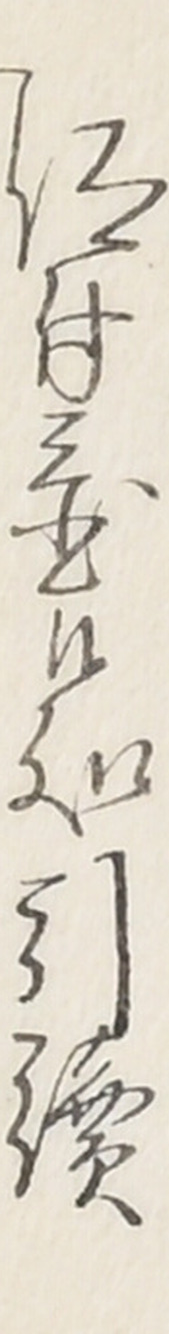仰付置候処引續
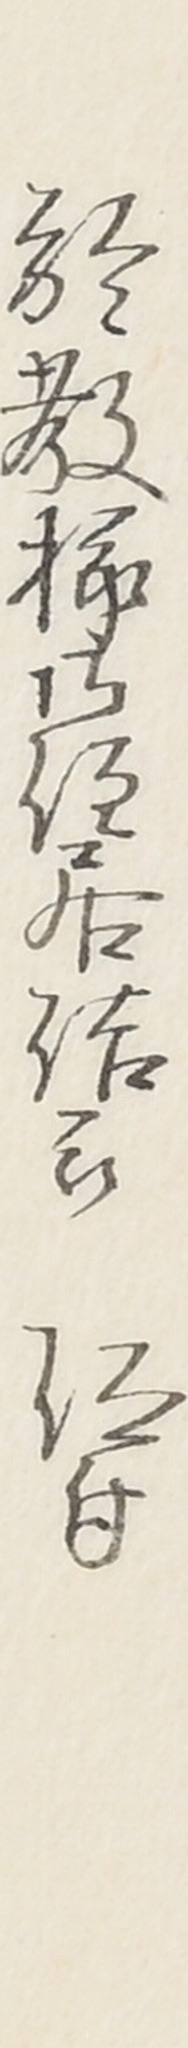於教様御住居詰被仰付
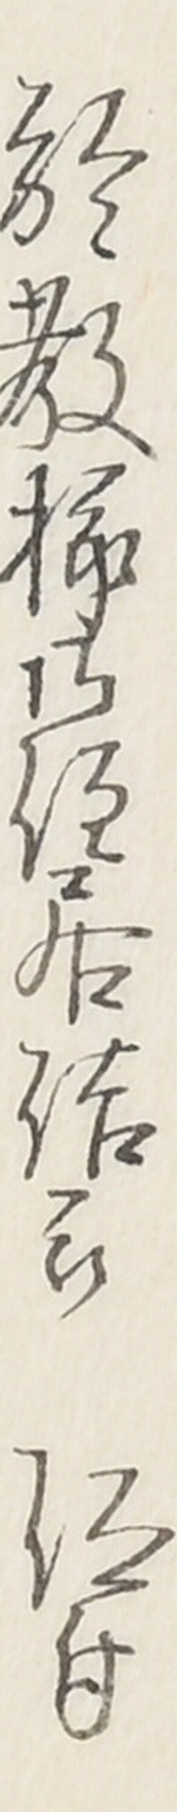於教様御住居詰被仰付
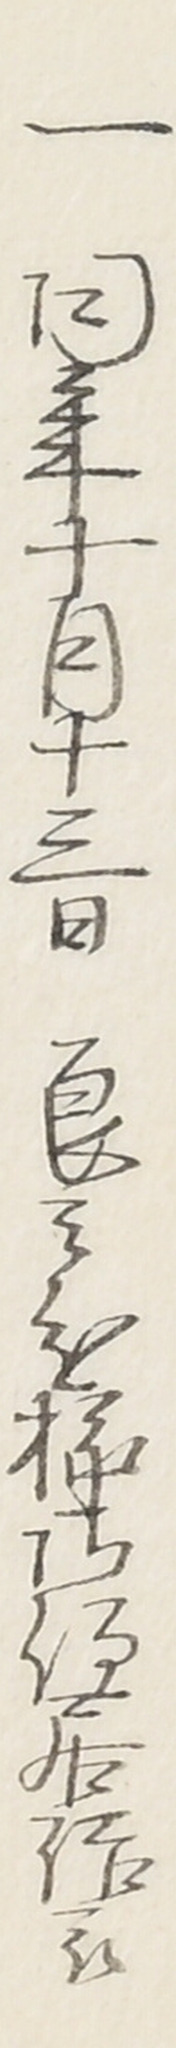一同年十月十三日良之進様御住居詰被
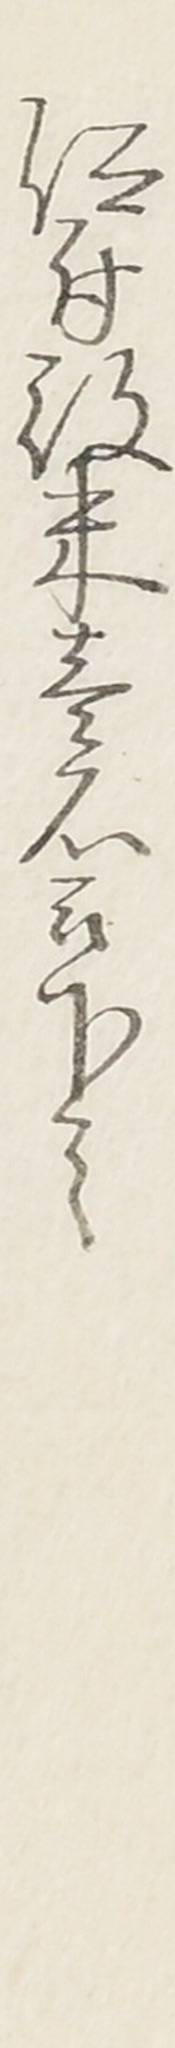仰付役米壱石被下之
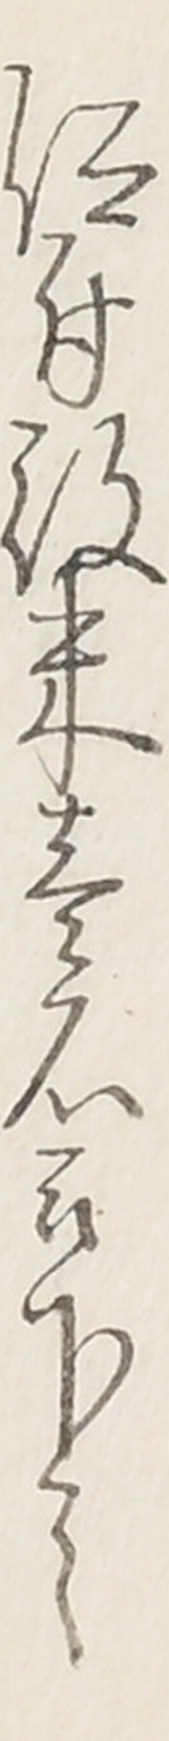仰付役米壱石被下之
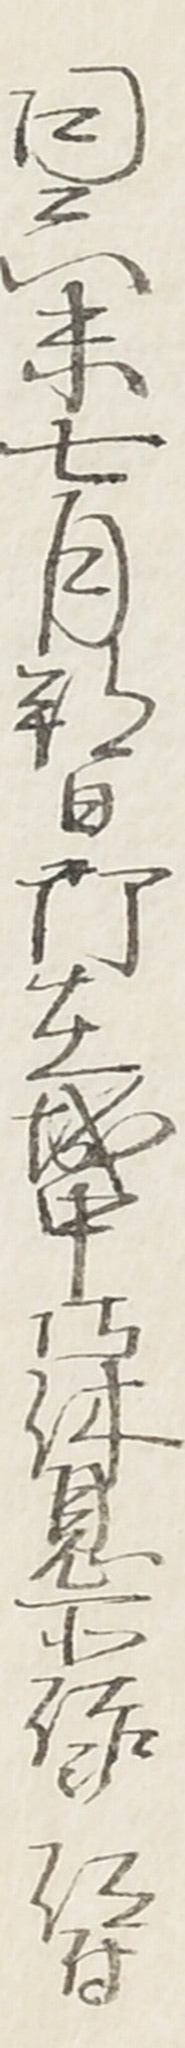一同六未七月朔日御在城中御休息所詰被仰付
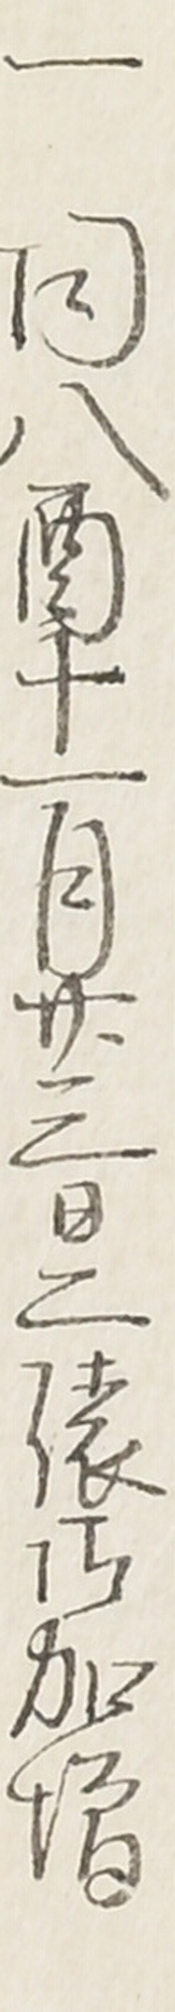一同八酉十一月廿三日二俵御加増
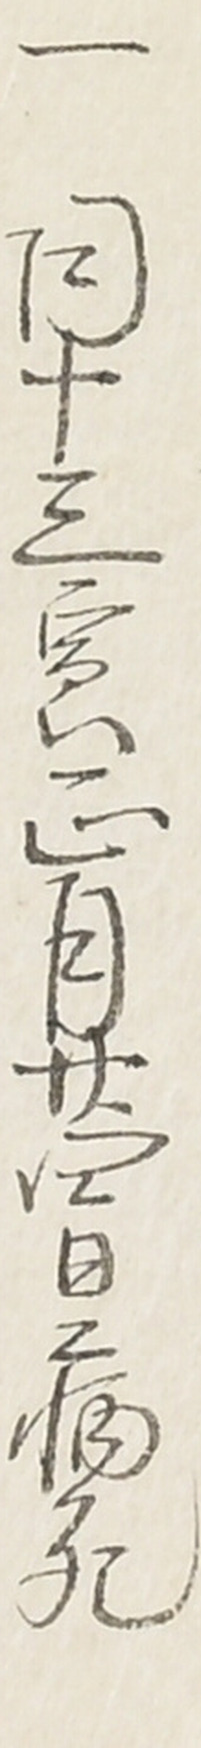一同十三寅正月廿四日病死
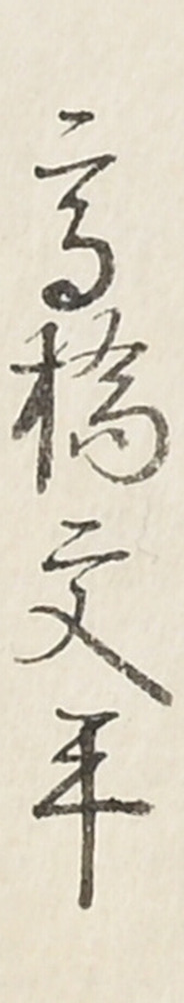高橋文平
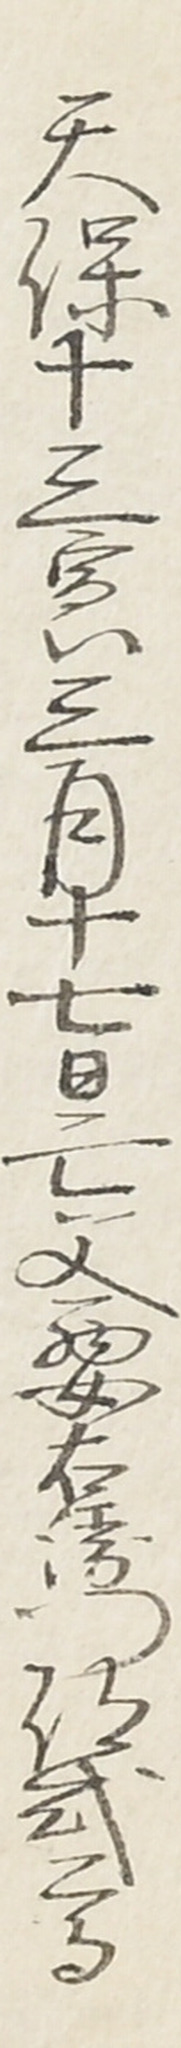一天保十三寅三月十七日亡父要右衛門跡式高
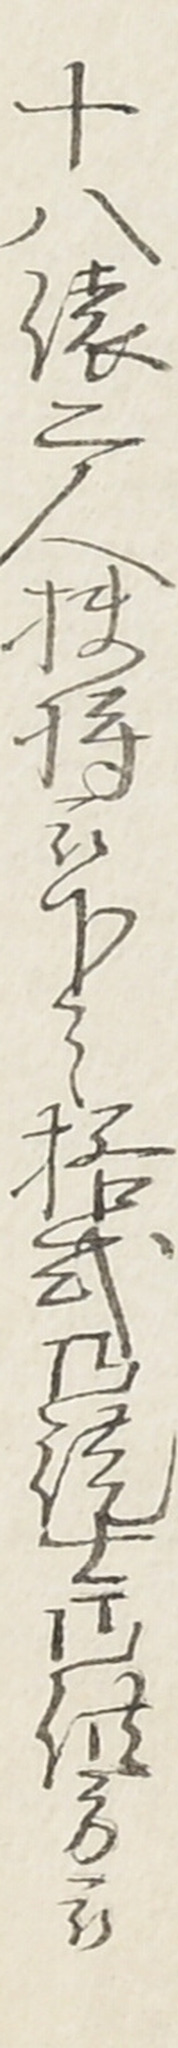十八俵二人扶持被下之格式御徒士御供方被
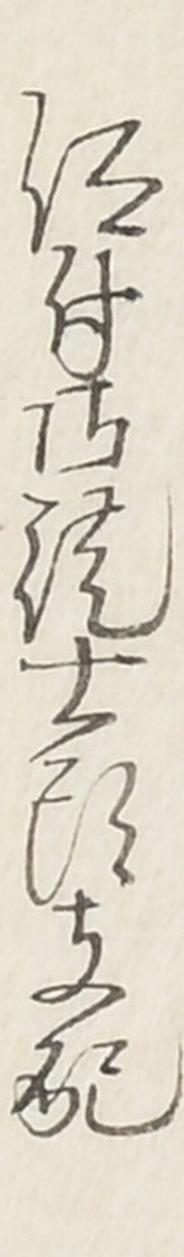仰付御徒士頭支配

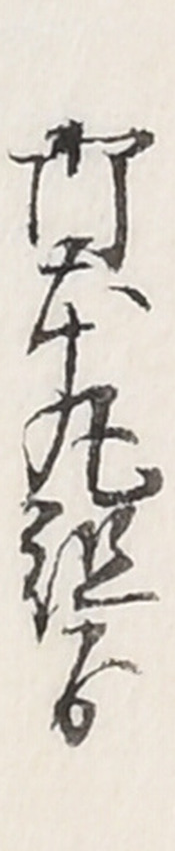御本丸組ゟ
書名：無足諸士勤仕録（四）
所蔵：伊那市立高遠町図書館・合同会社AMANE
